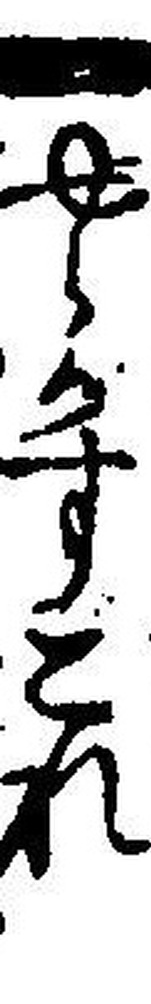やらかすこれ
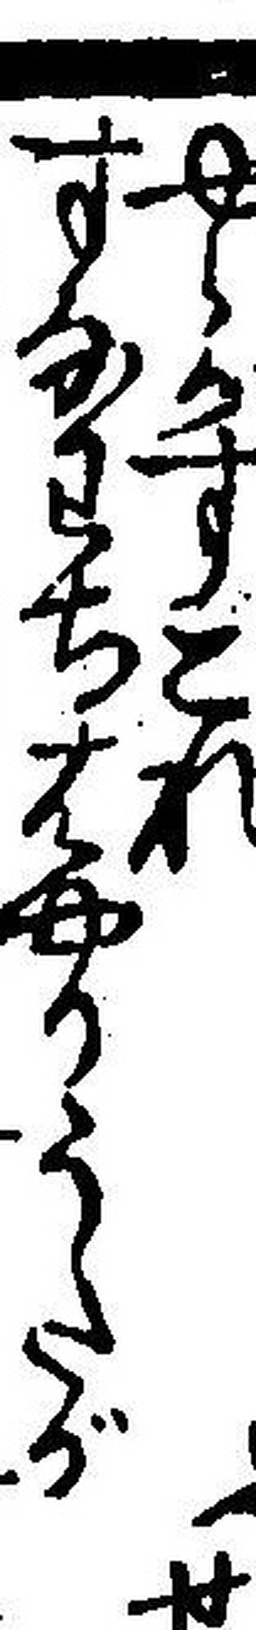すなわちはやりうたが
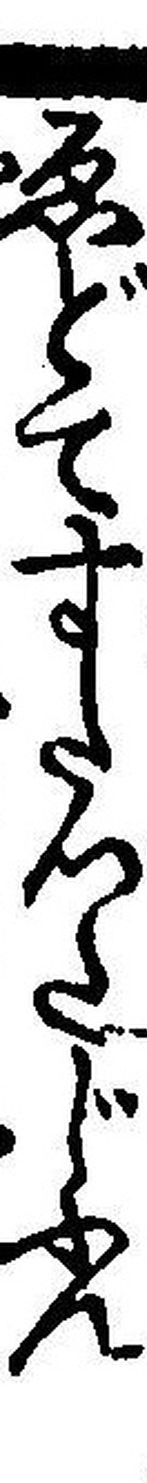ゑどてすたつたじふん
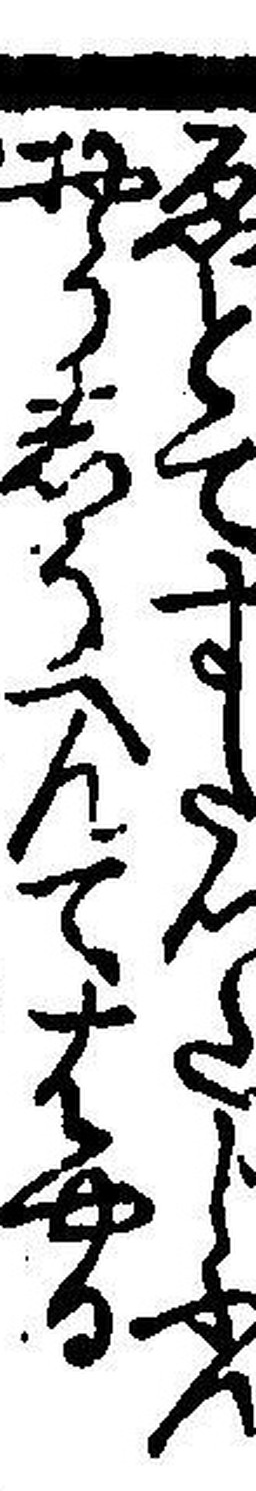おうしうへんてはやる
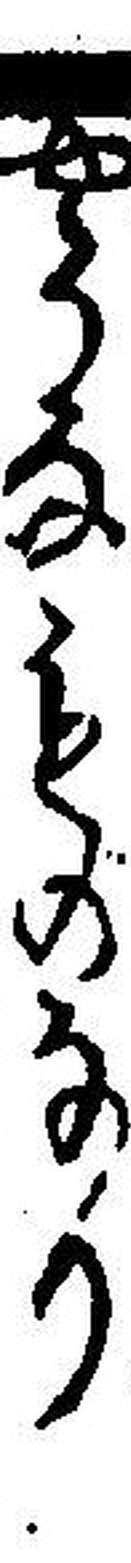やうなものなり

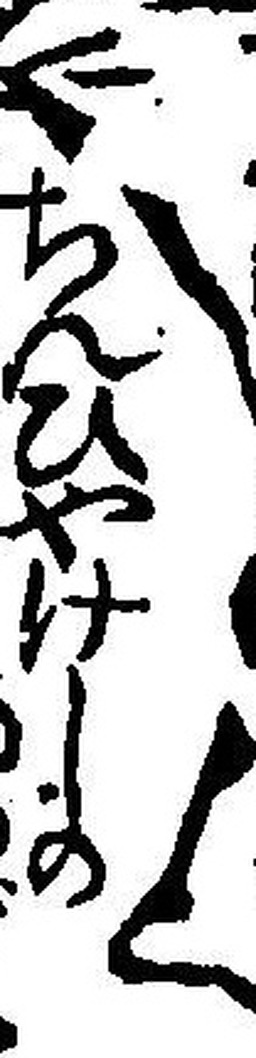ちんひやけしの
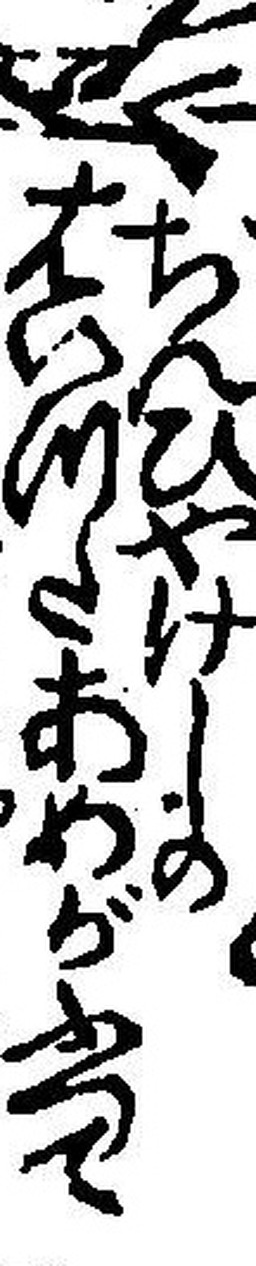はいつたあめがふつて
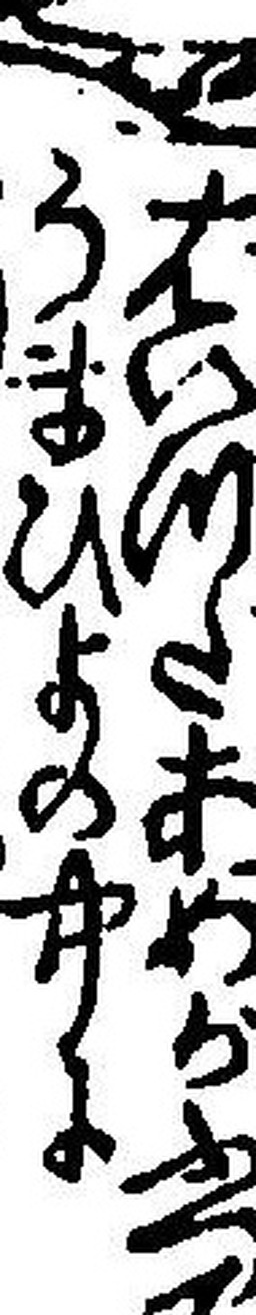うまひよの中に
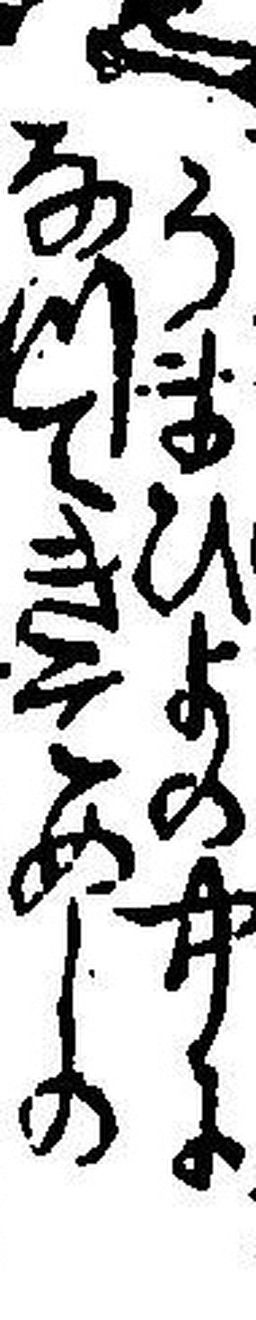なつてきてめしの
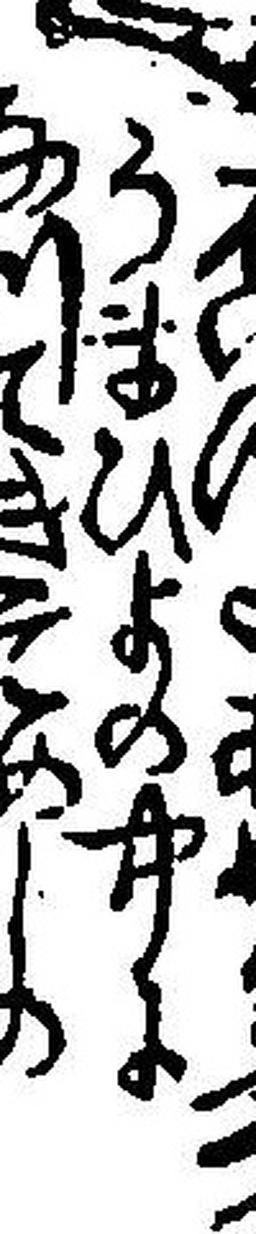なつてきてめしの
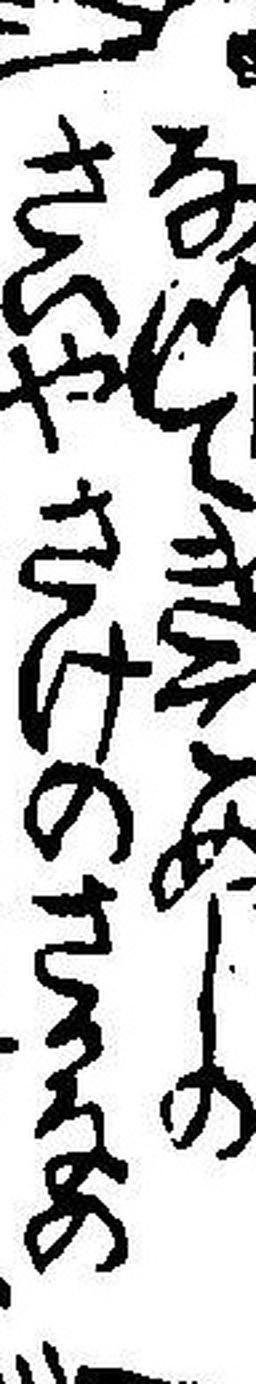さいやさけのさかなの
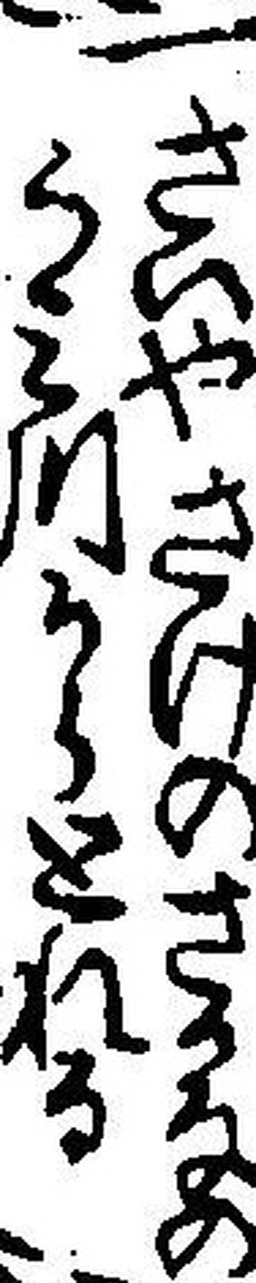うみ川からとれる
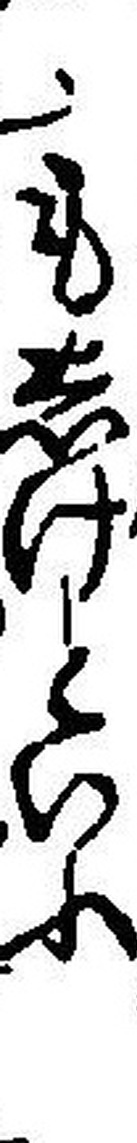もしけといふ
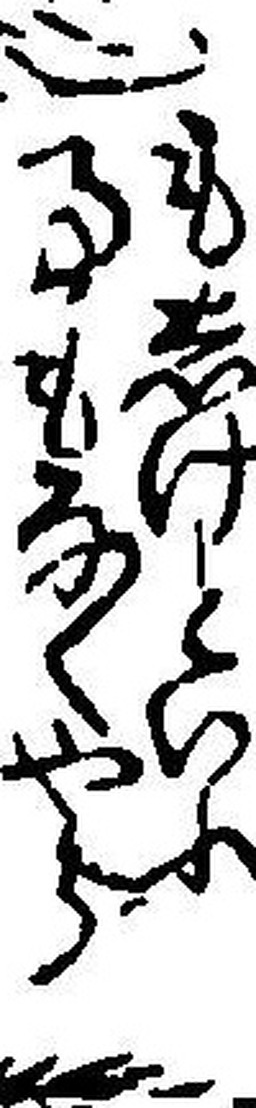事もなくやら
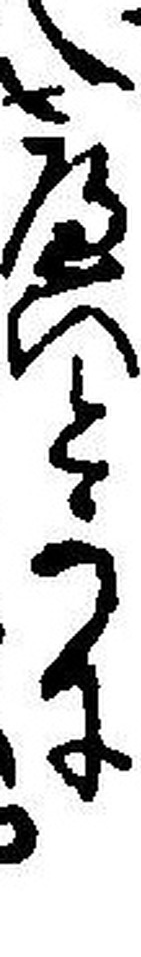へいとうに
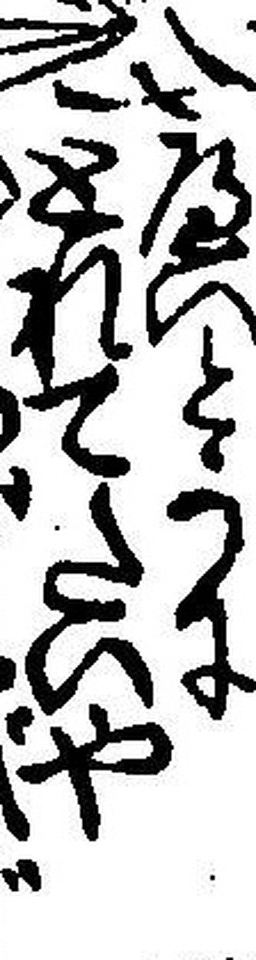とれてたいや
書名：徳若水縁起金性 / 樹下石上作
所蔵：東京大学総合図書館 General Library in the University of Tokyo, JAPAN
